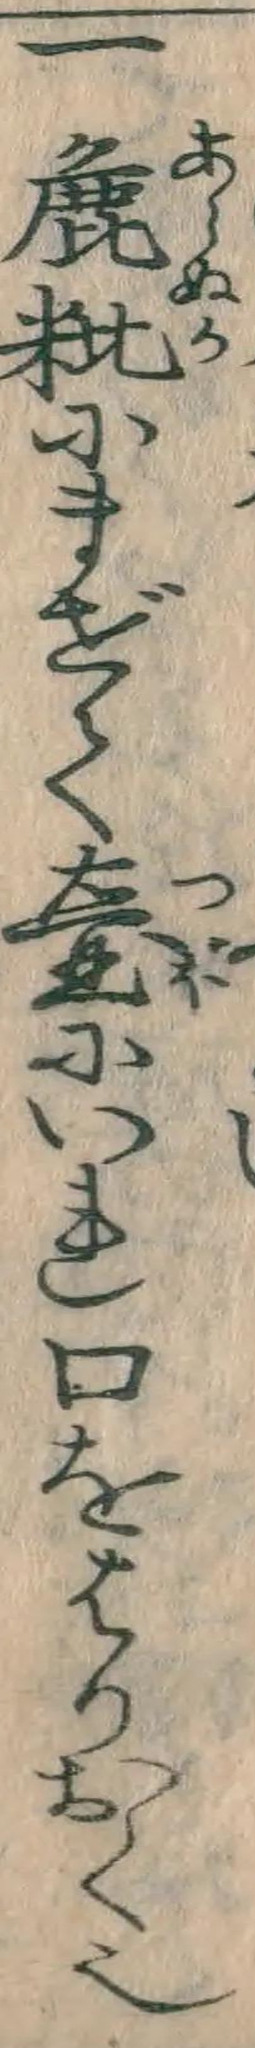一麁粃にまぜて壺にいれ口をはりおく也
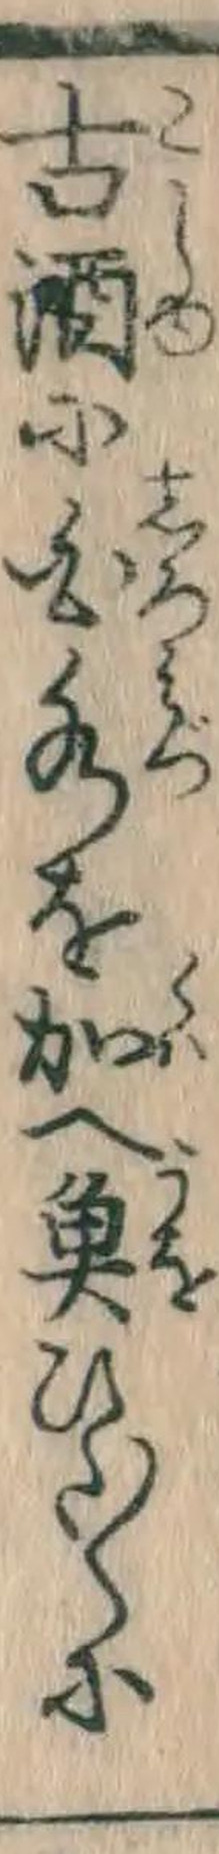古酒に白水を加へ魚ひた〳〵に
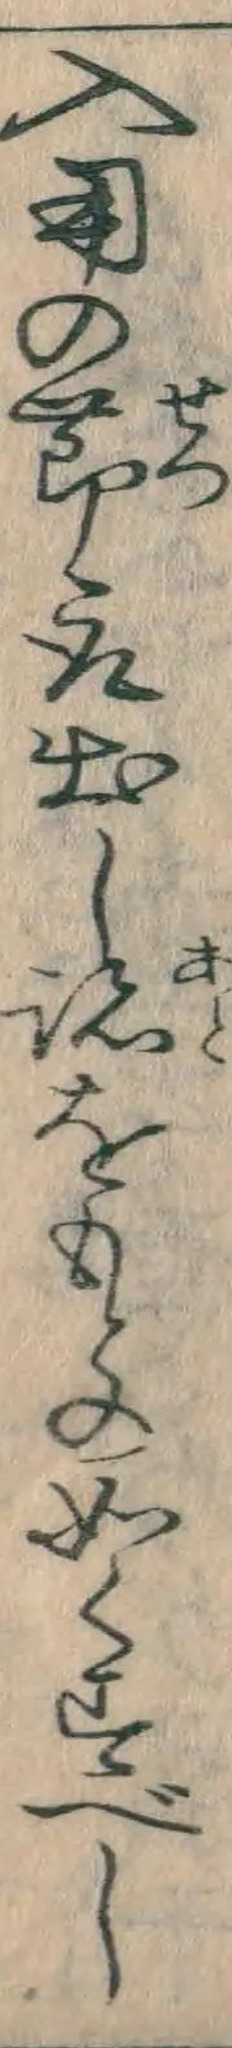入用の節取出し跡をもとの如くすべし
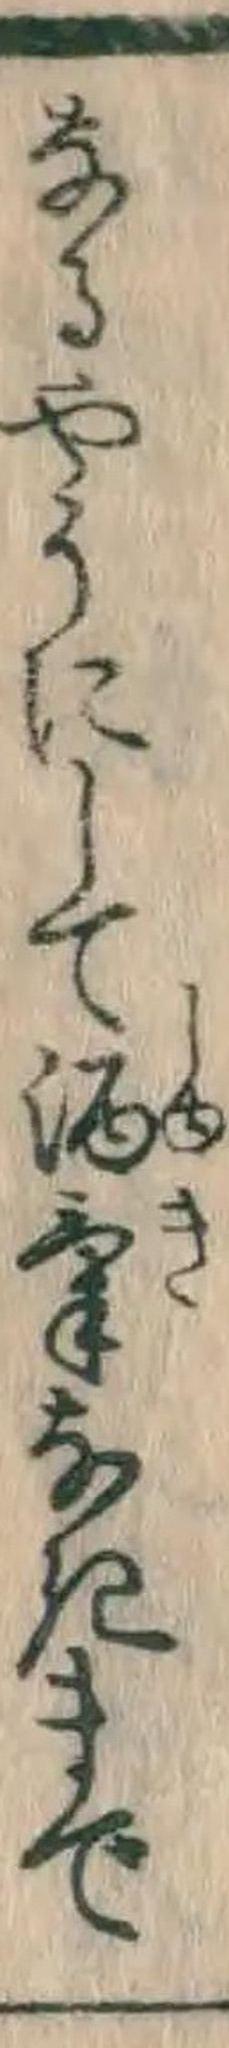なるやうにして酒気なきまで
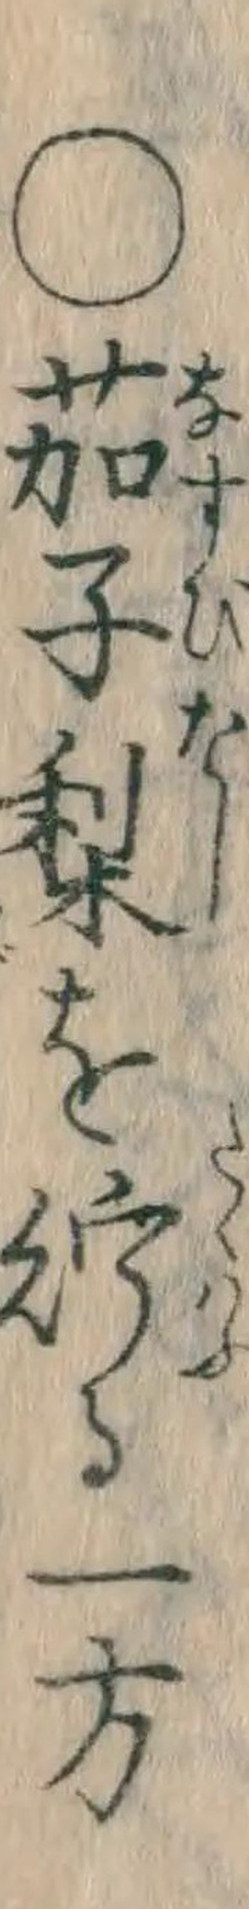○茄子梨を貯る一方
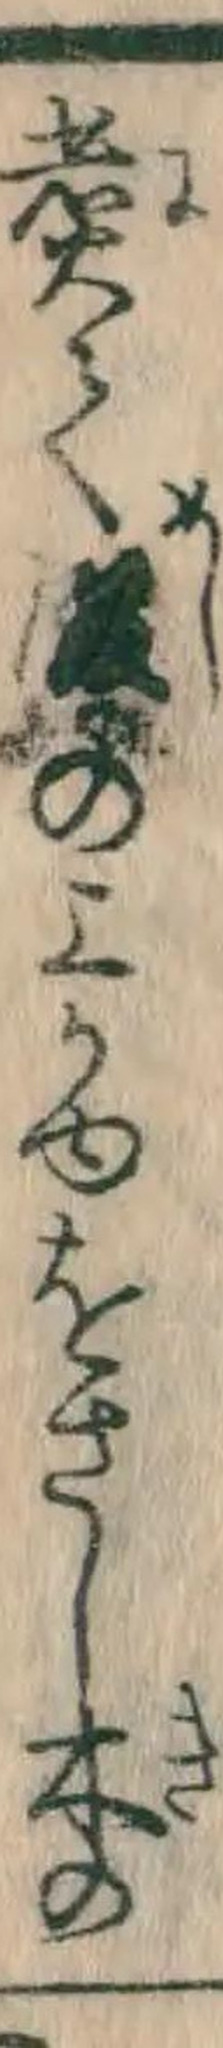煮ての上かゆをさし木の
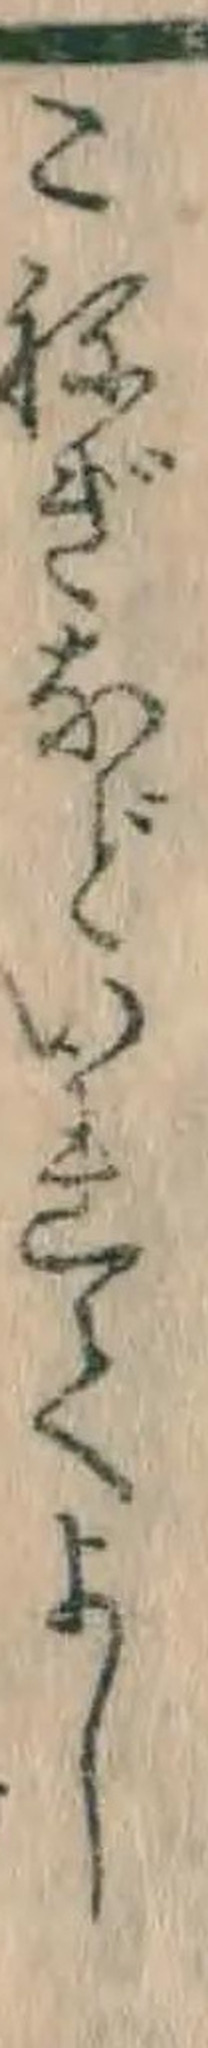こねぎなどいれてよし
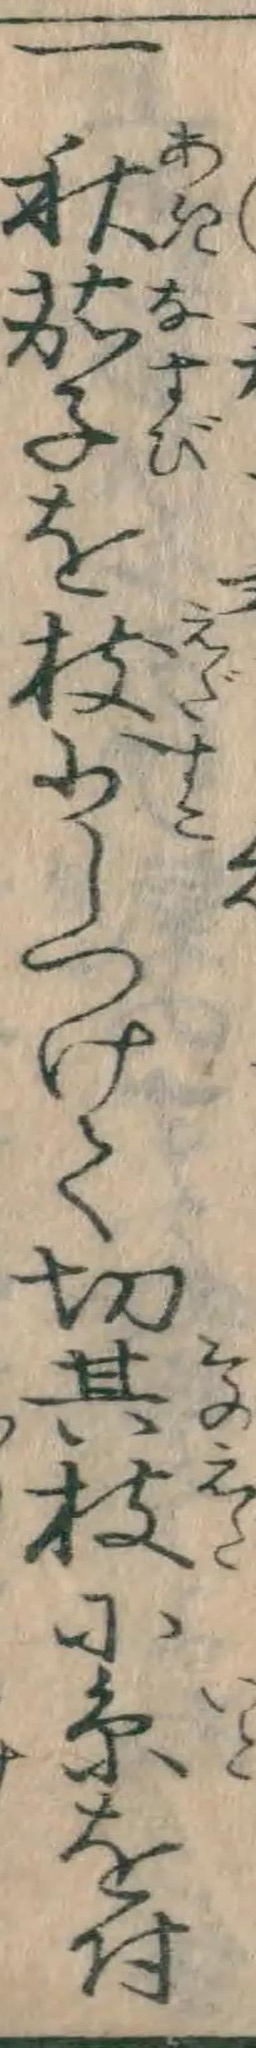一秋茄子を枝少しつけて切其枝に糸を付
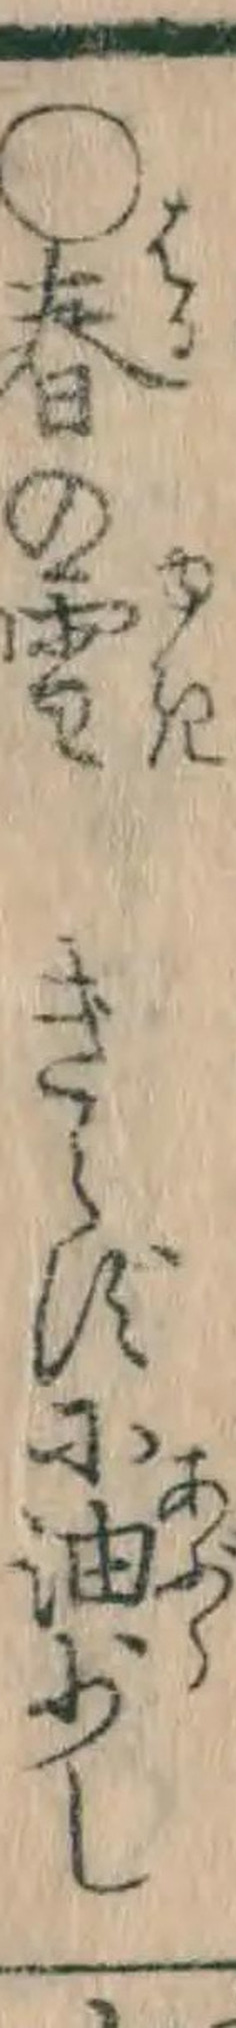○春の雪きらずに油少し
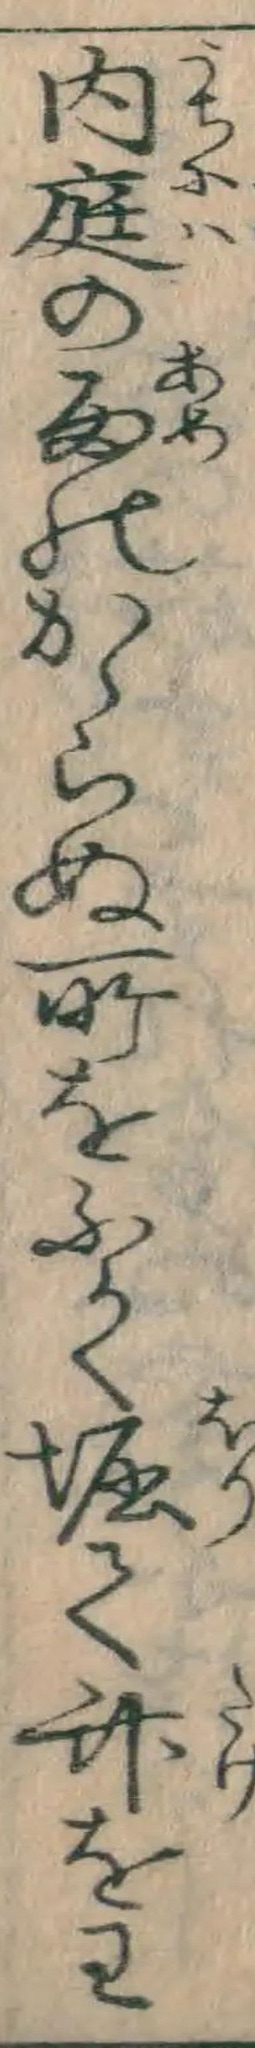内庭の雨のかゝらぬ所をふかく堀て竹をわ

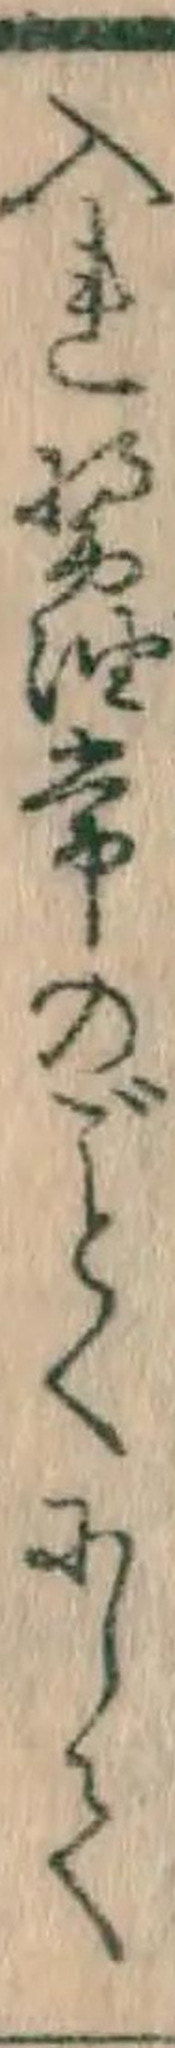入れ醬油常のごとくにして
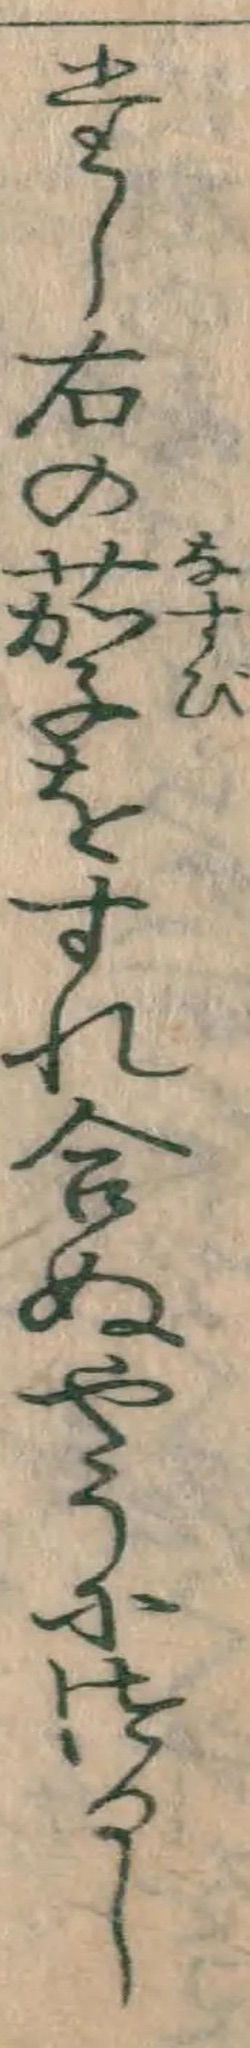たし右の茄子をすれ合ぬやうにつるし
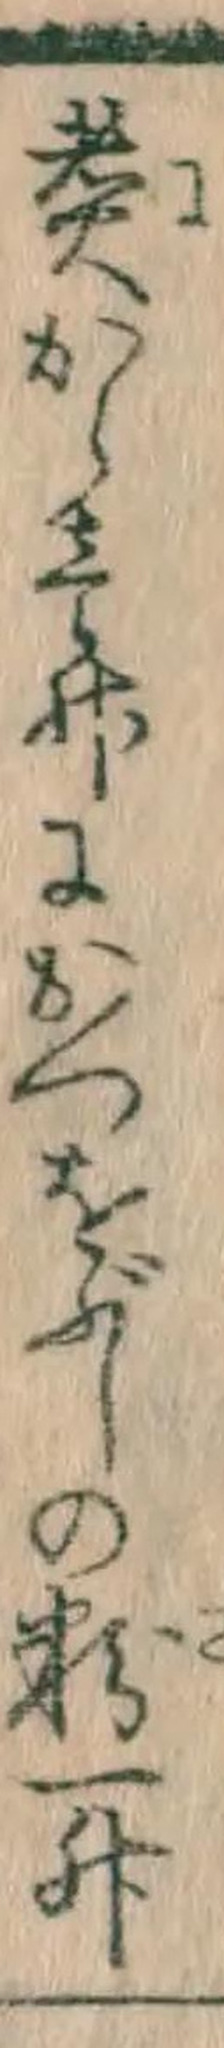煮から壱升にかつをぶしの粉一升
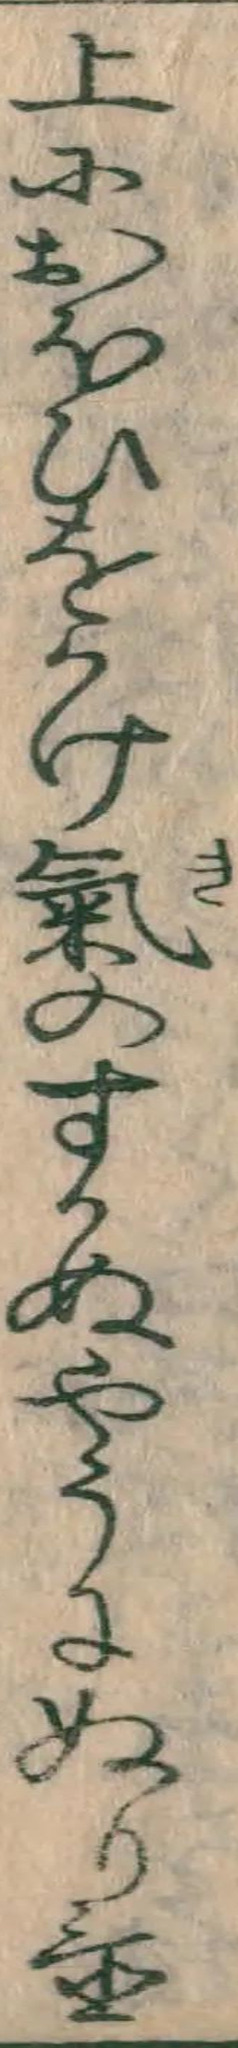上におほひをかけ気のすかぬやうにぬり置
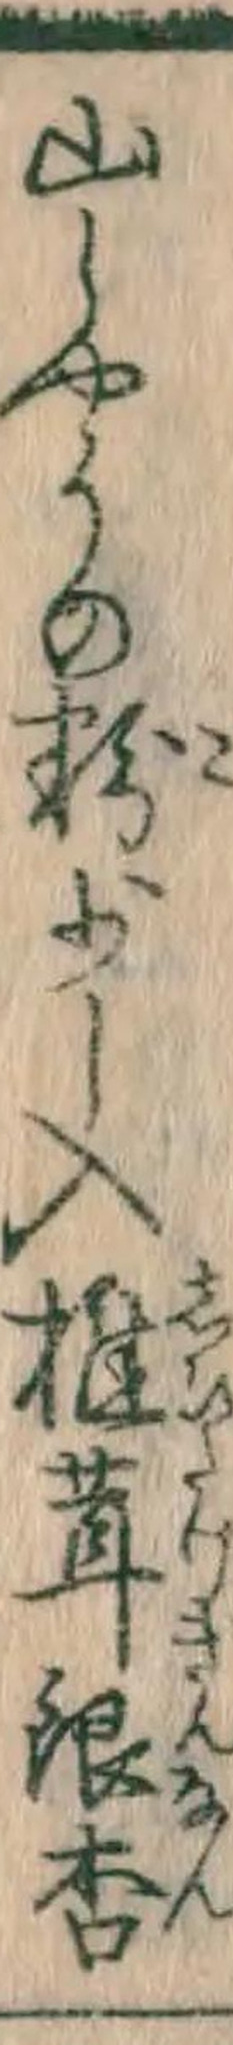山しやうの粉少し入椎茸銀杏
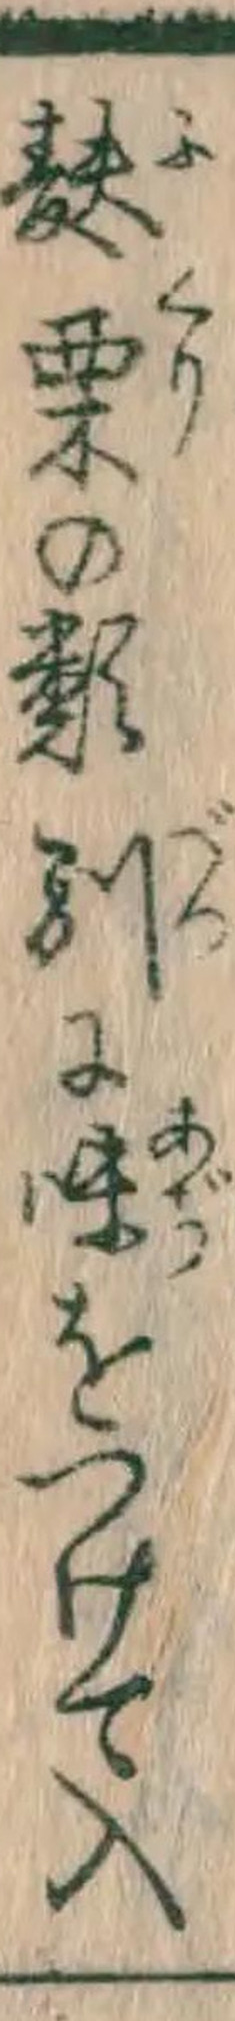麩栗の類別に味をつけて入
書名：広益秘事大全 3巻. [5]
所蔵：国立国会図書館 National Diet Library, JAPAN
